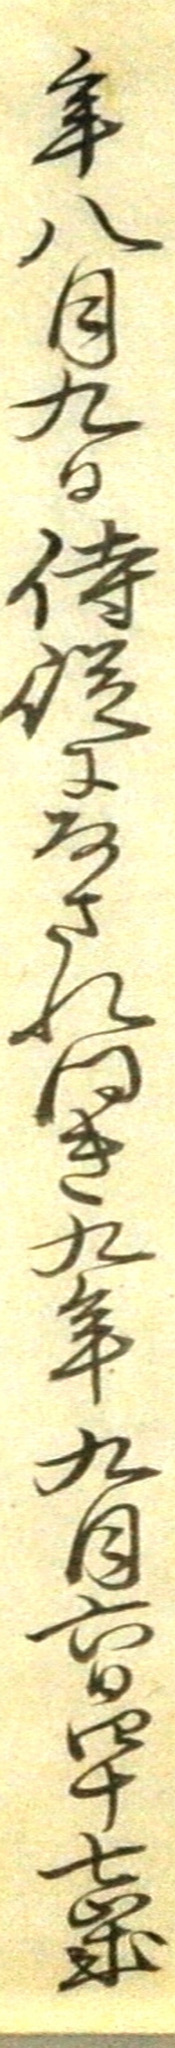年八月九日侍従になされ同き九年九月六日四十七歳
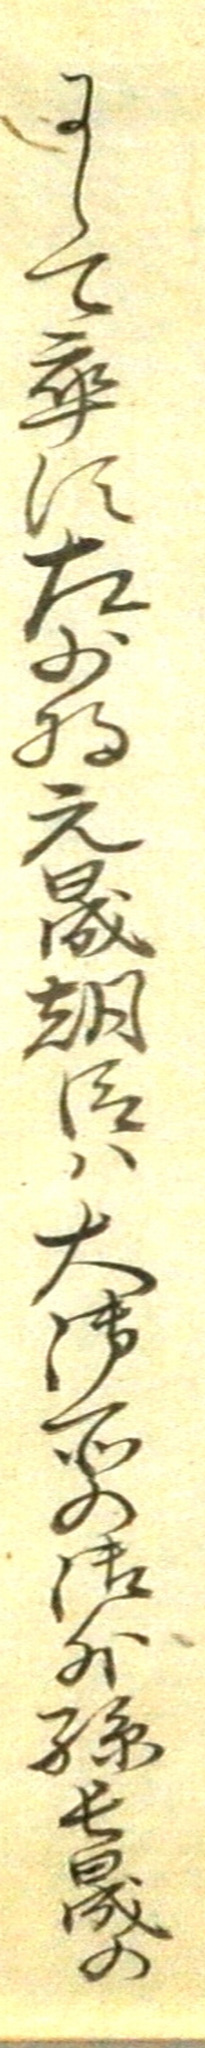にして卒す左少将元晟朝臣は大御所の御外孫長晟の
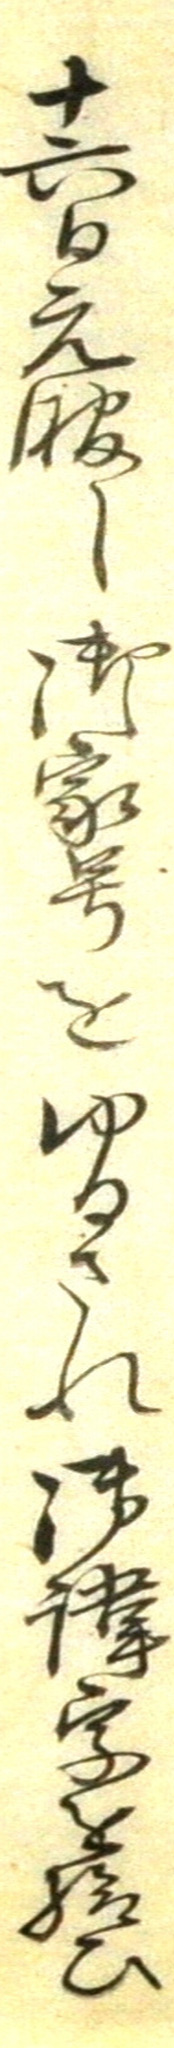十六日元服し御家号をゆるされ御諱字を給ひ
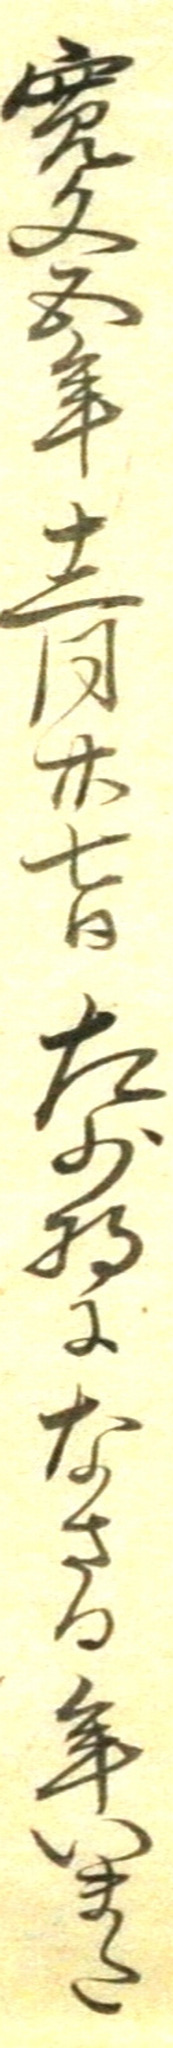寛文五年十二月廿七日左少将になさる年いまた
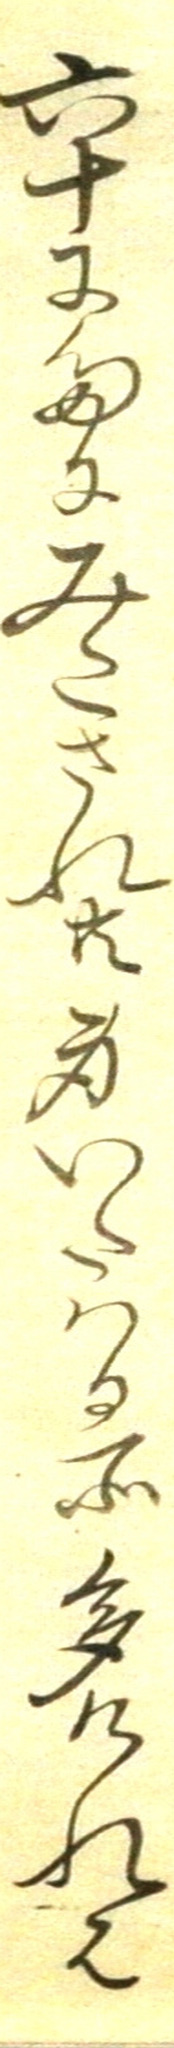六十にたにみたされ共身いたはる所多けれは
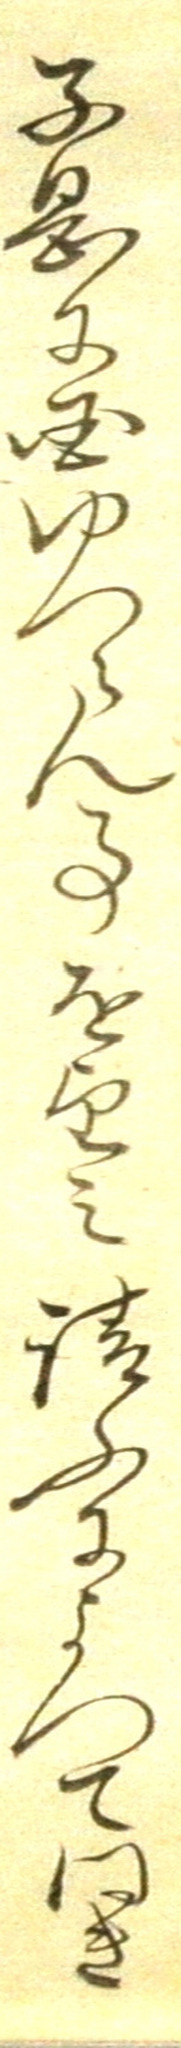子息に国ゆつらん事を望み請ふによつて同き
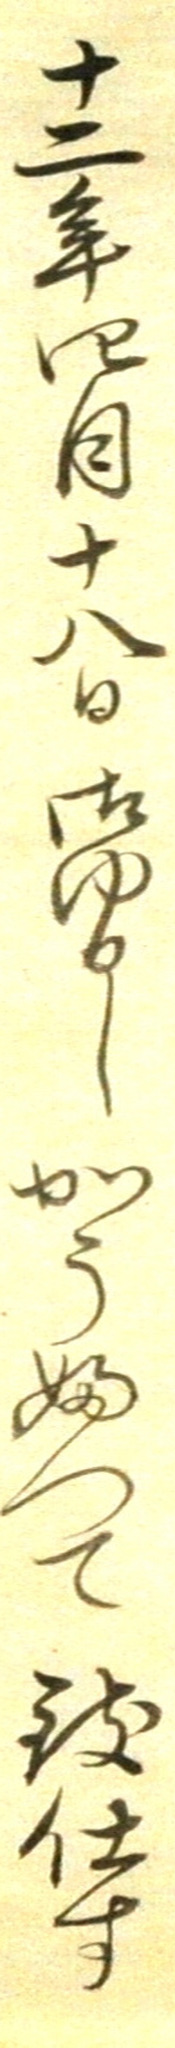十二年四月十八日御ゆるしかうふつて致仕す
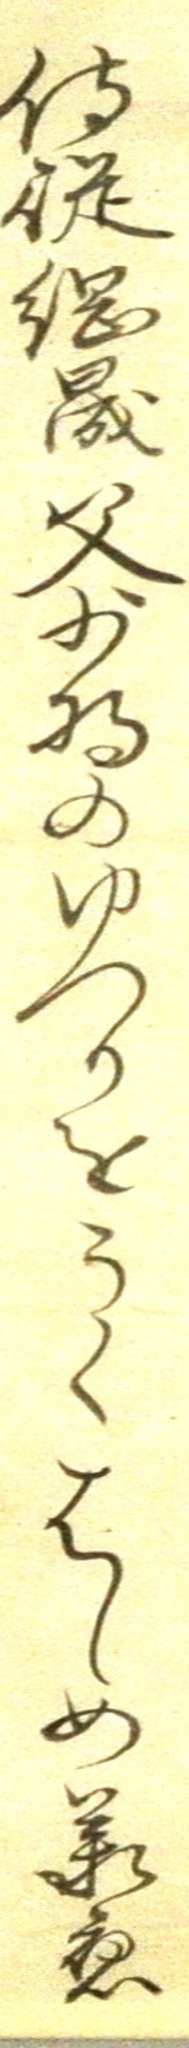侍従綱晟父少将のゆつりをうくはしめ承応
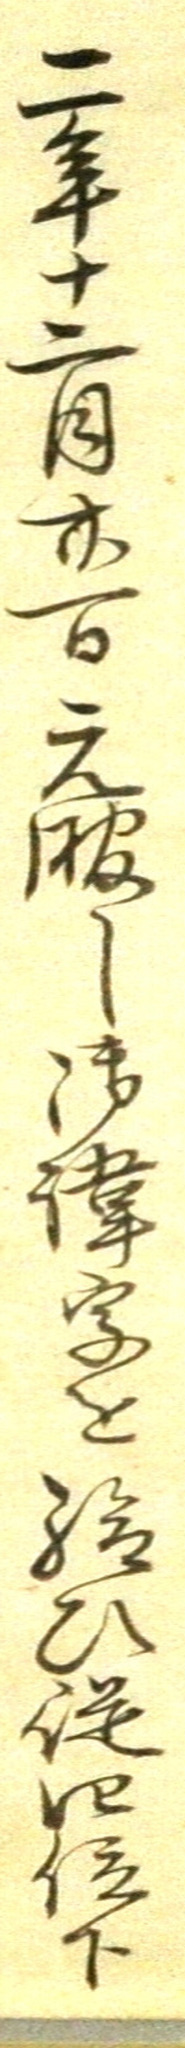二年十二月廿一日元服し御諱字を給ひ従四位下
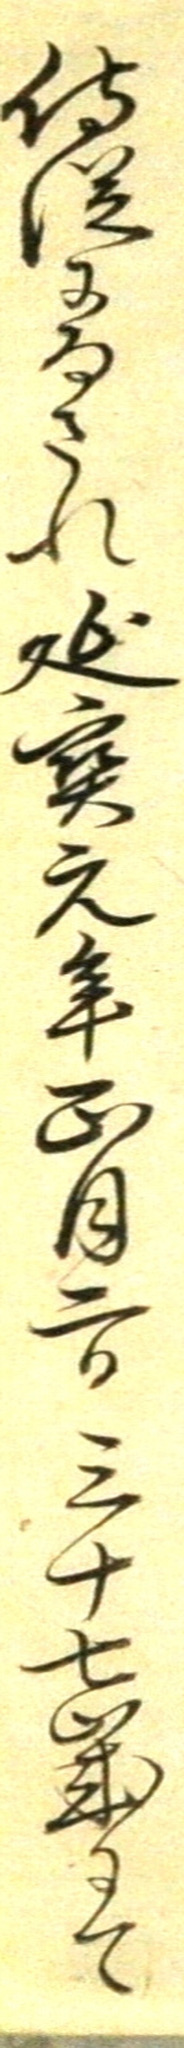侍従になされ延宝元年正月二日三十七歳にて
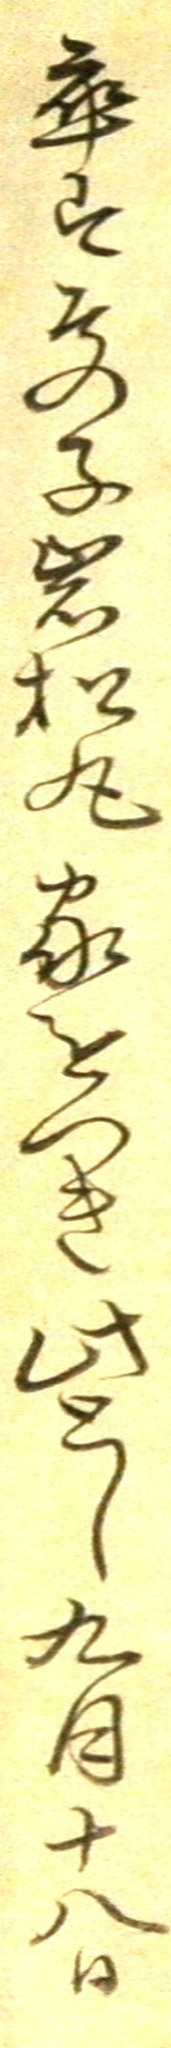卒すその子岩松丸家をつき此とし九月十八日

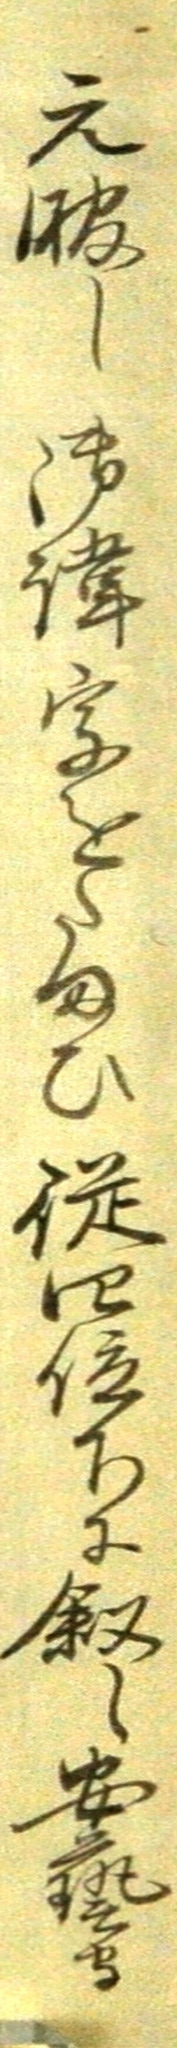元服し御諱字をたまひ従四位下に叙し安芸守
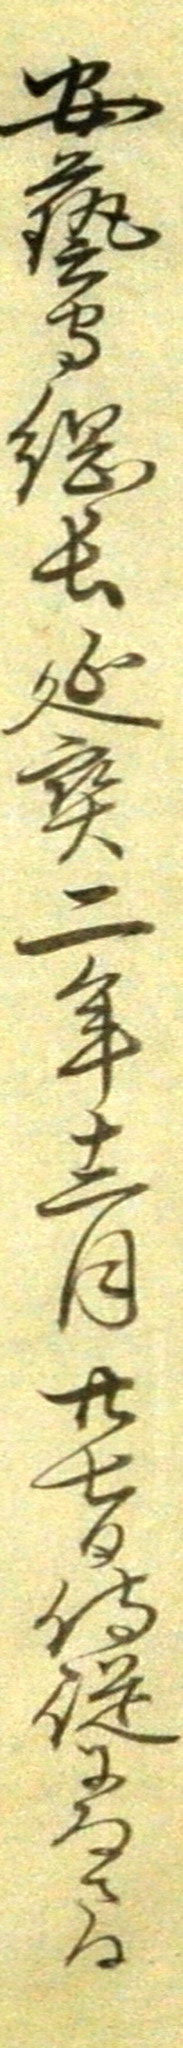安芸守綱長延宝二年十二月廿七日侍従になさる
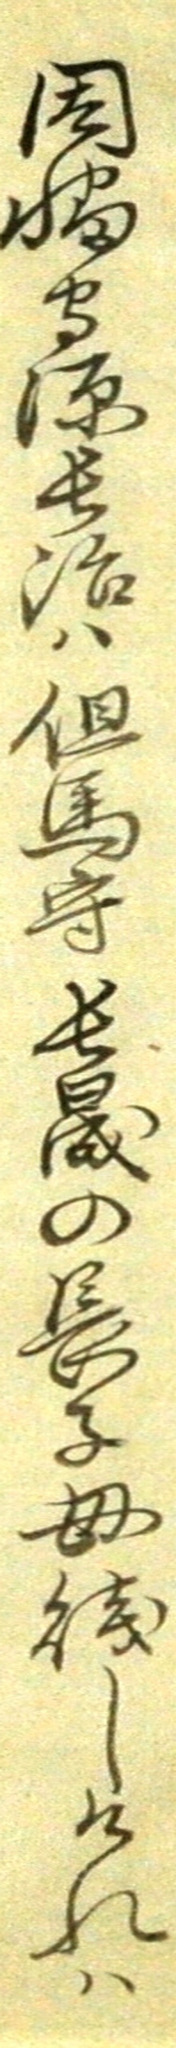因幡守源長治は但馬守長晟の長子母賤しけれは
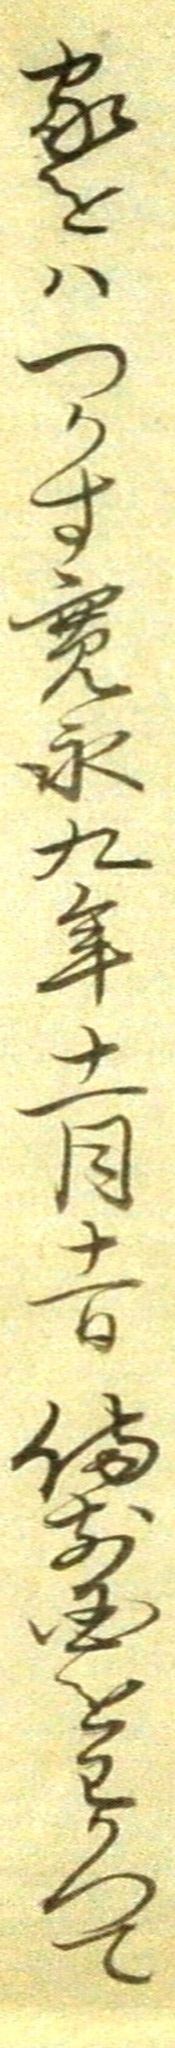家をはつかす寛永九年十一月十一日備前国をわかつて
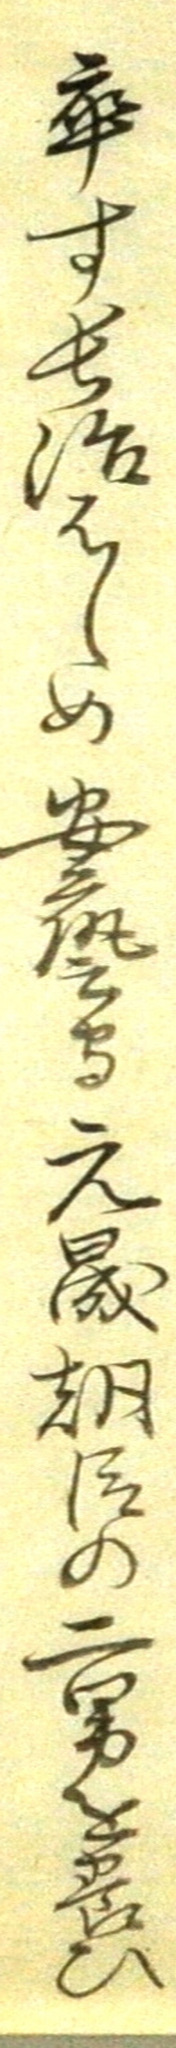卒す長治はしめ安芸守元晟朝臣の二男を養ひ
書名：藩翰譜（七・上）
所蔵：伊那市立高遠町図書館・合同会社AMANE
